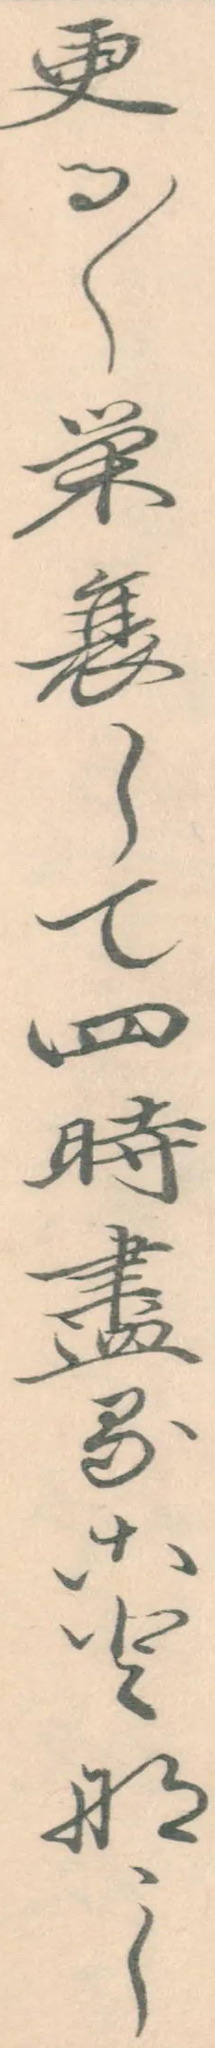更る〳〵栄衰して四時尽ることなし

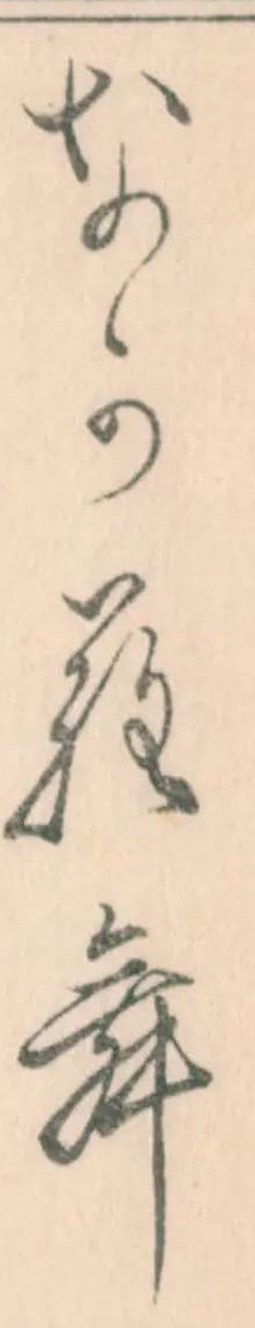なからむ
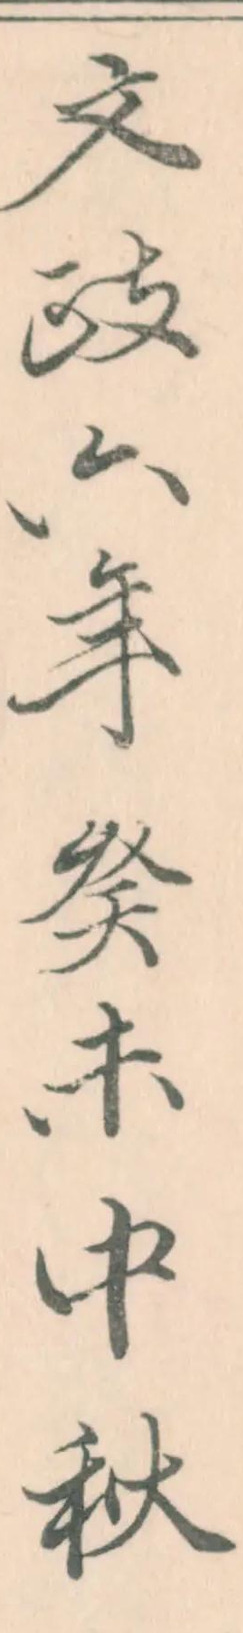文政六年癸未中秋

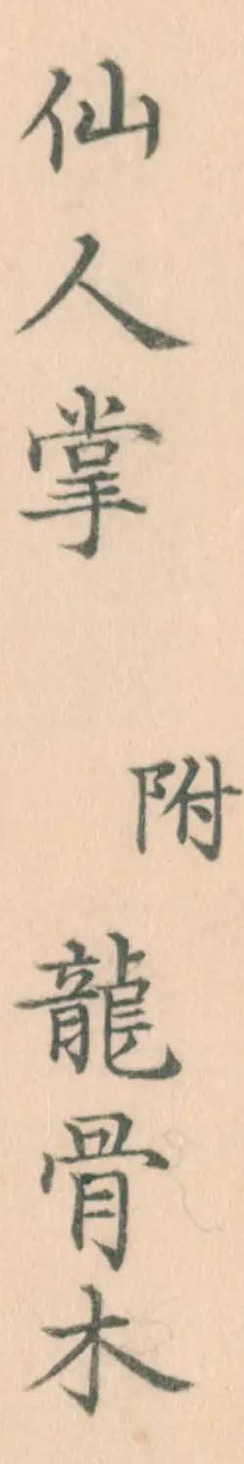仙人掌附龍骨木
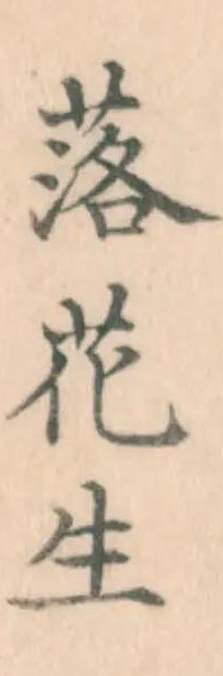落花生
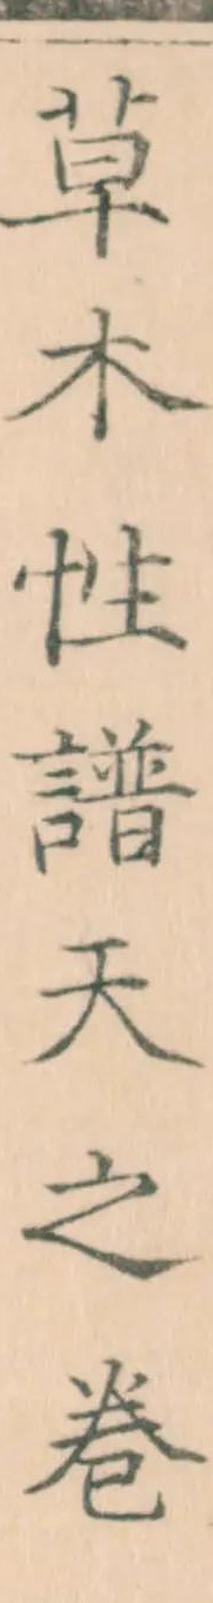草木性譜天之巻
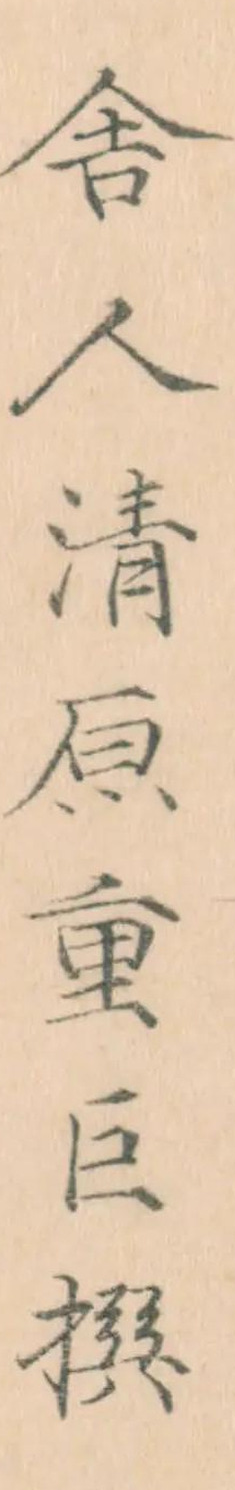舎人清原重巨撰
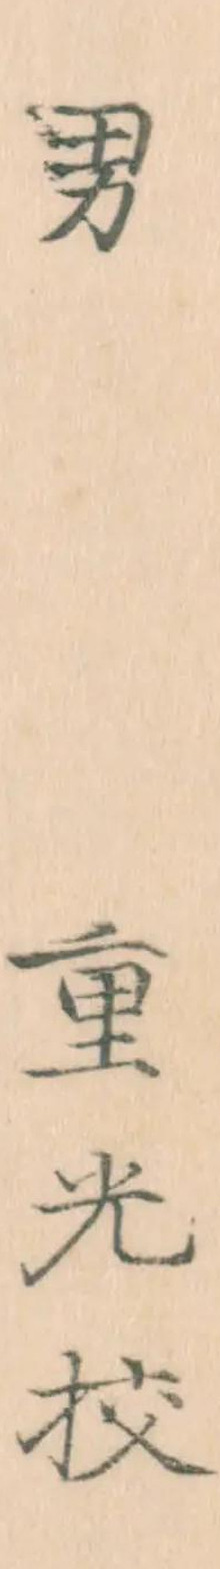男重光校
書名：草木性譜 3巻. [1]
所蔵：国立国会図書館 National Diet Library, JAPAN
